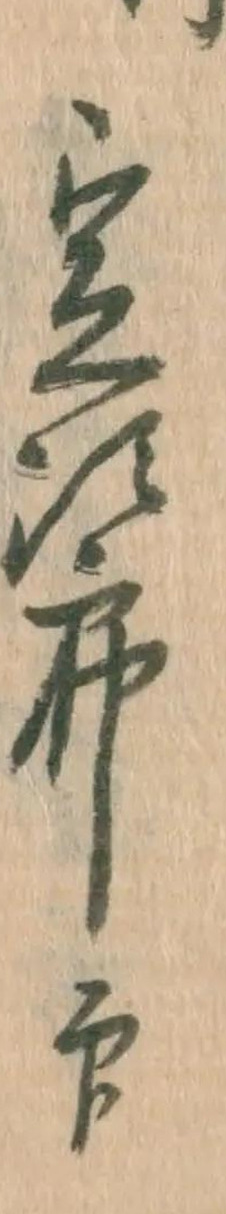同定次郎印
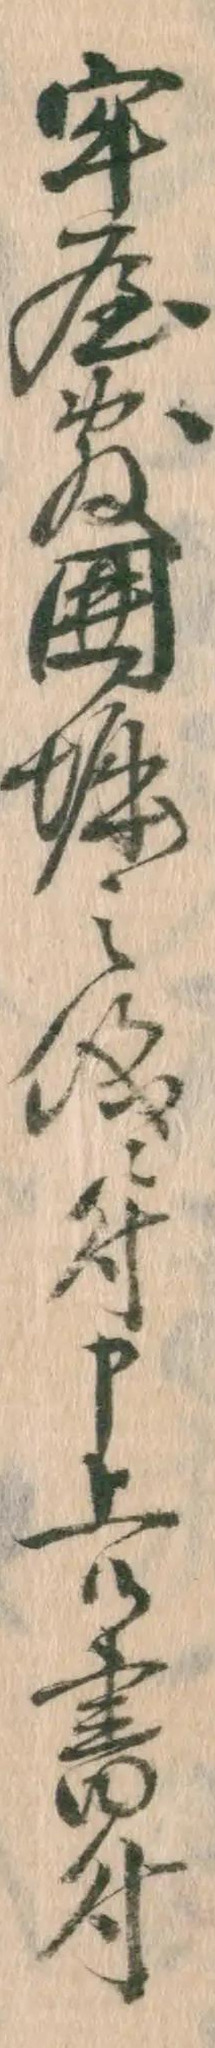│牢屋敷囲堀之儀ニ付申上候書付
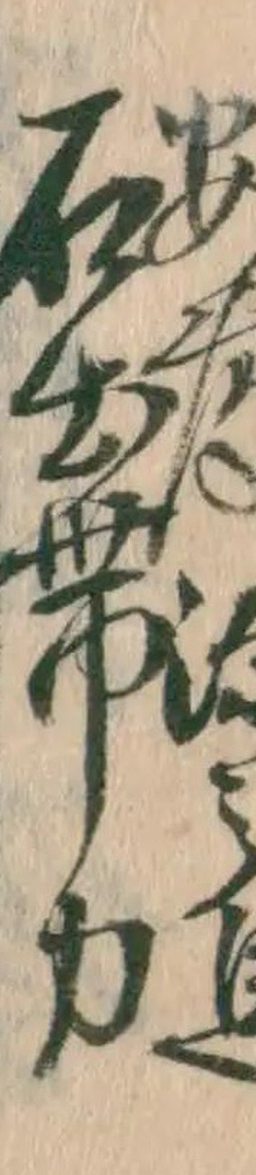│石出帯刀
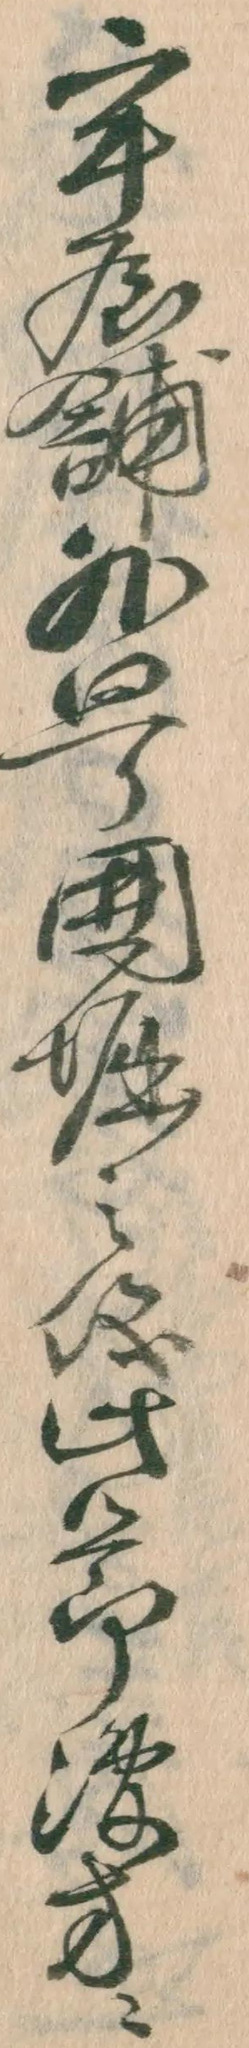牢屋鋪外廻り囲堀之儀此節浚方ニ
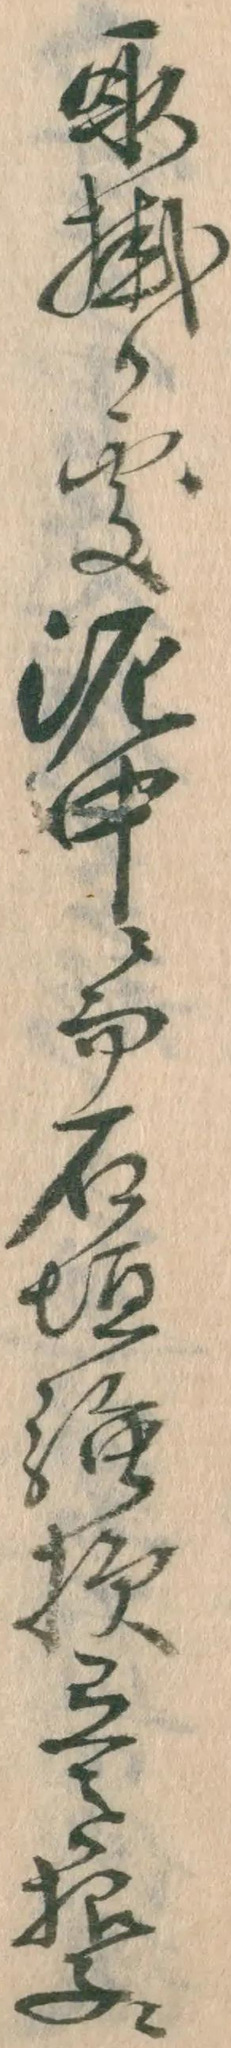取掛候処泥中ニて石垣強損有之候様子ニ

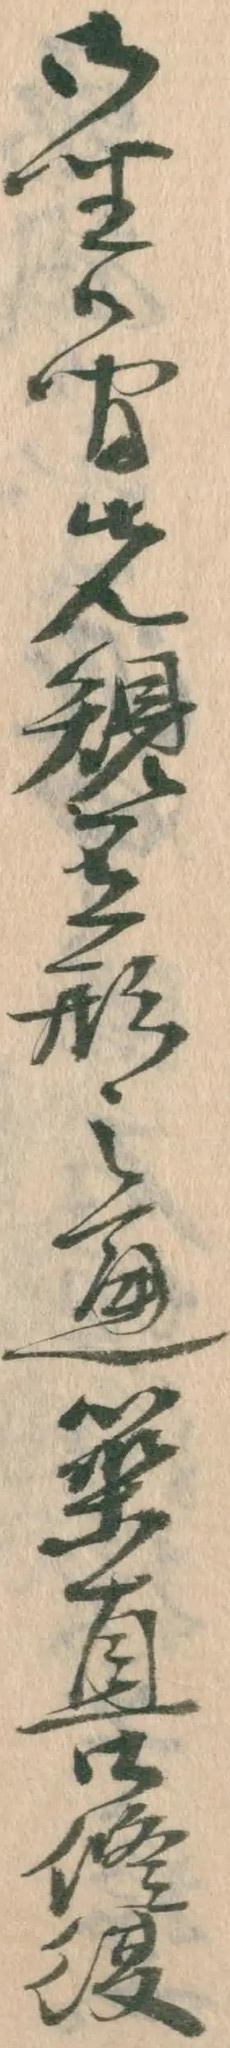御座候間先規有形之通築直御修復
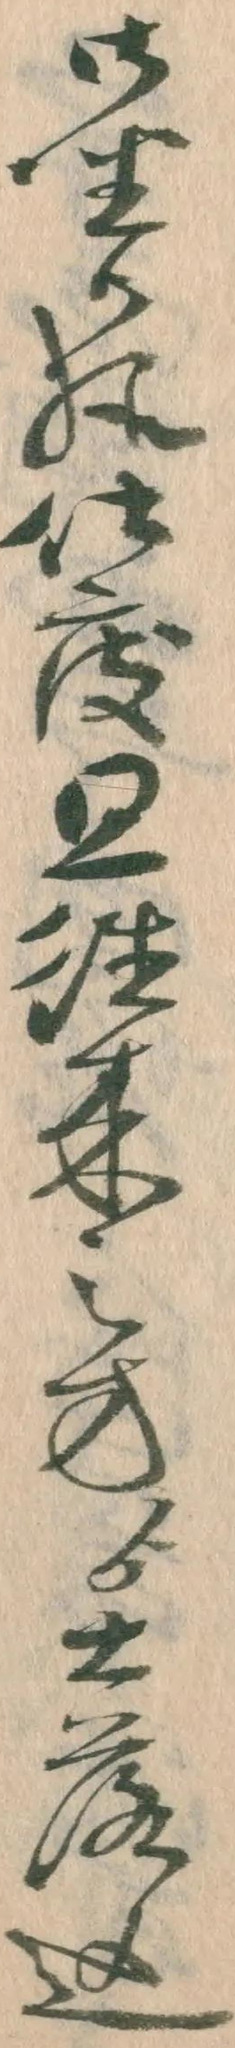御座候様仕度且往来之方ゟ土落込
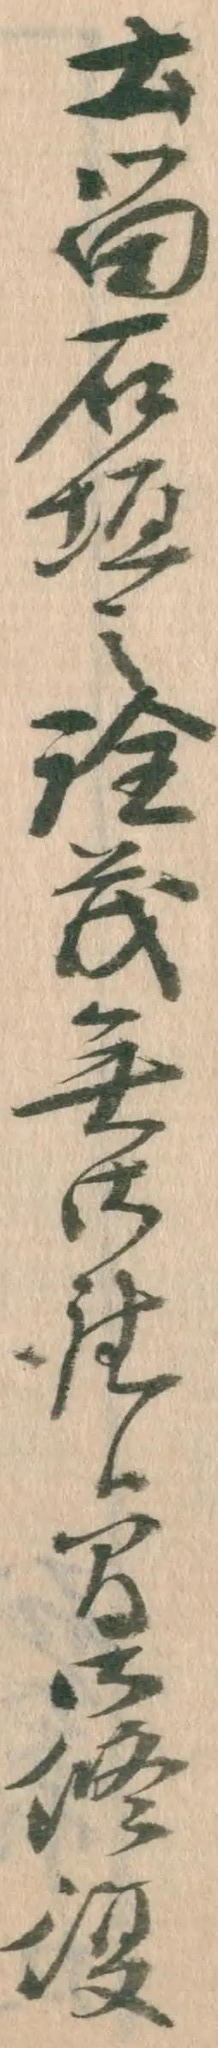土留石垣之詮も無御座候間御修復
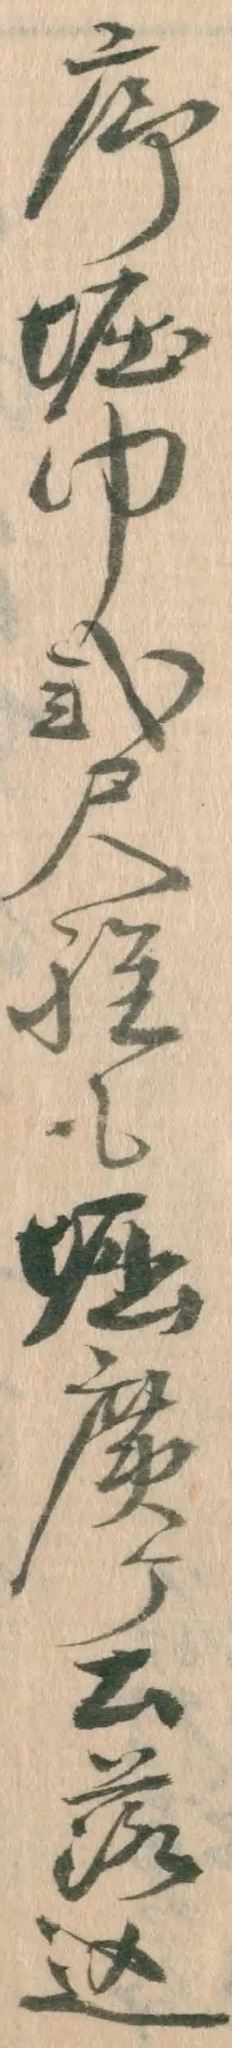序堀巾弐尺程も堀広ケ土落込
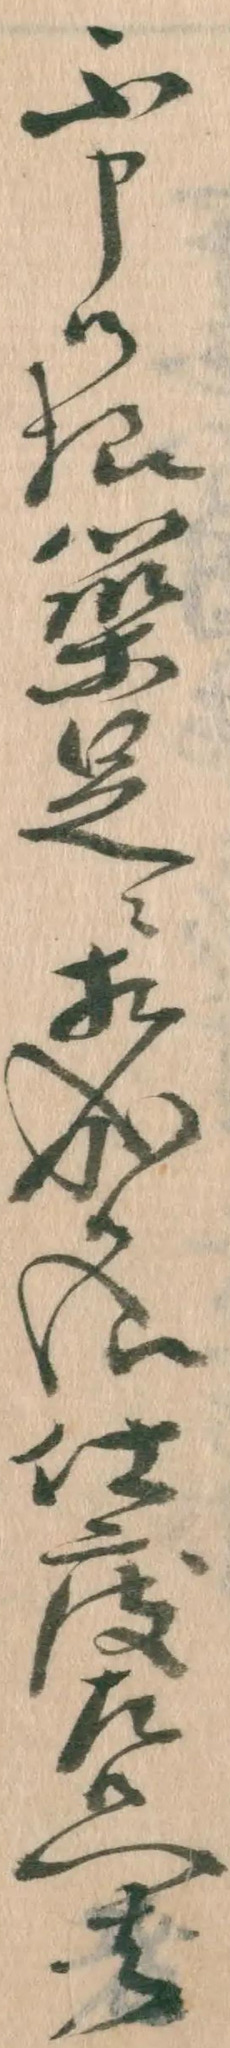不申候様築足ニ相成候様仕度左候へは
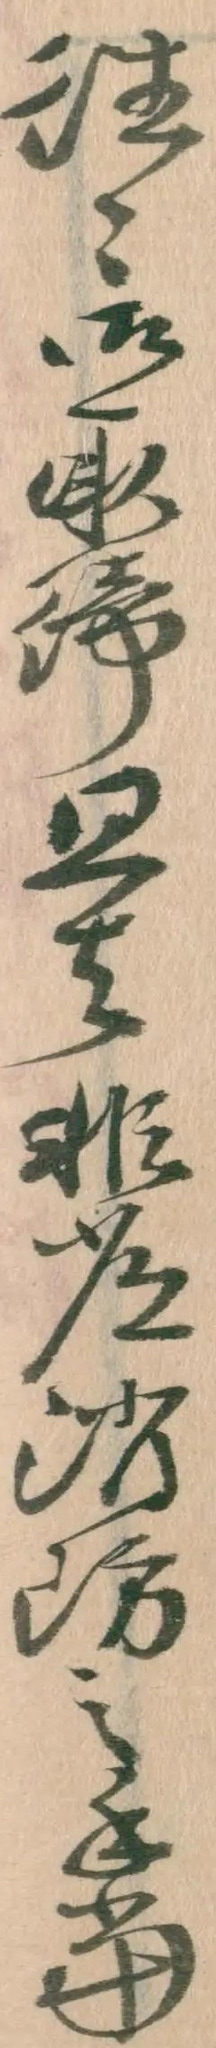徃〻御取締且は非常消防之手当
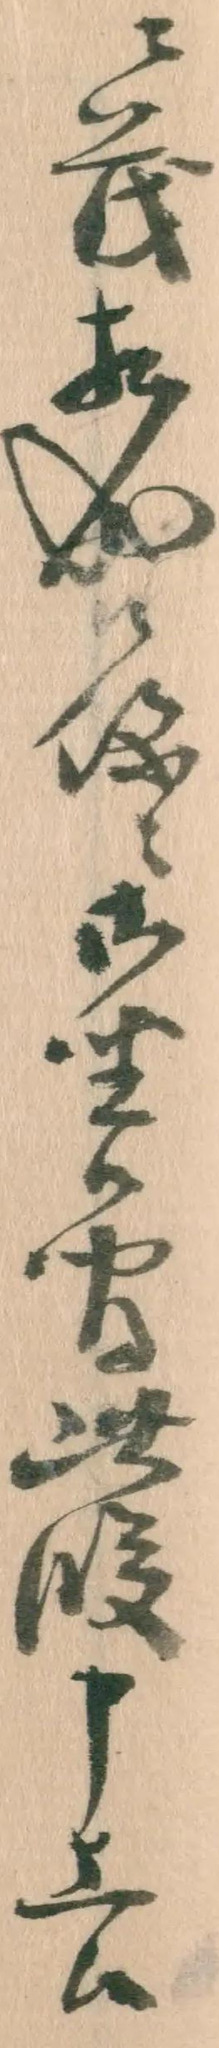ニも相成候儀ニ御坐候間此段申上候
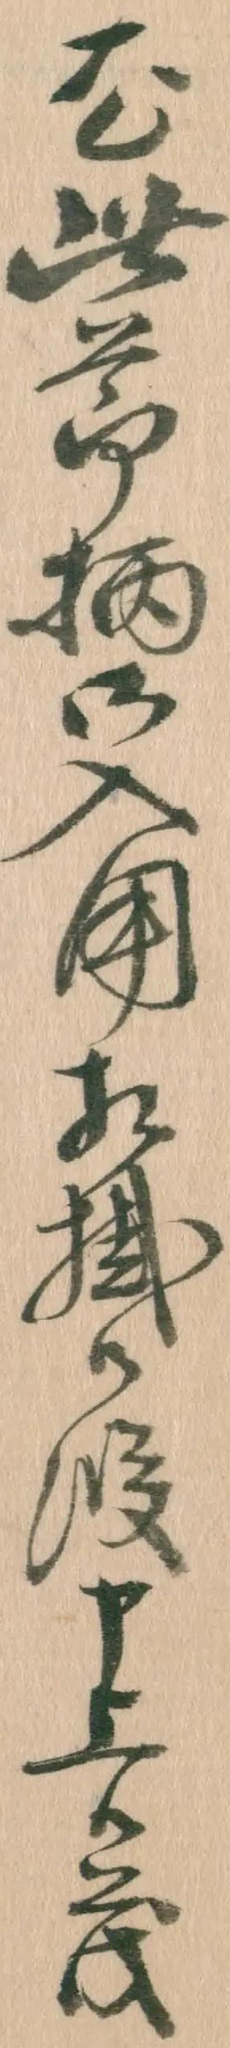尤此節柄御入用相掛候段申上候も
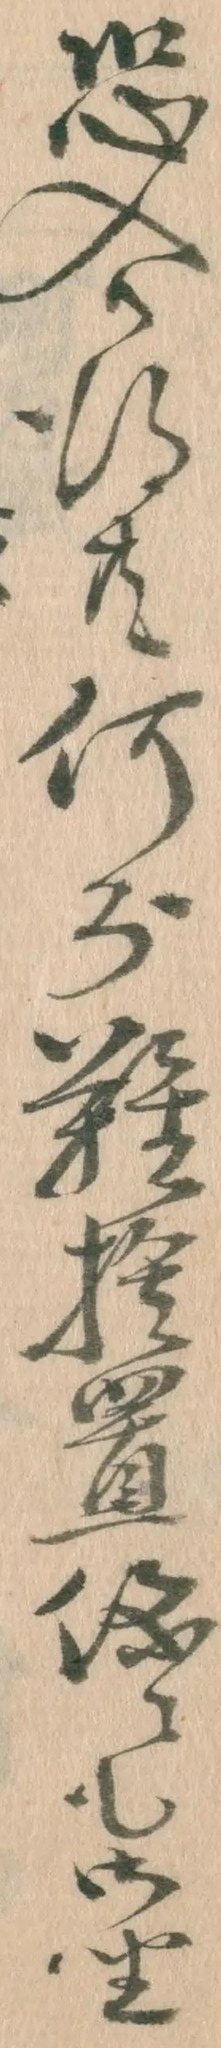恐入候得共何分難捨置儀ニも御座
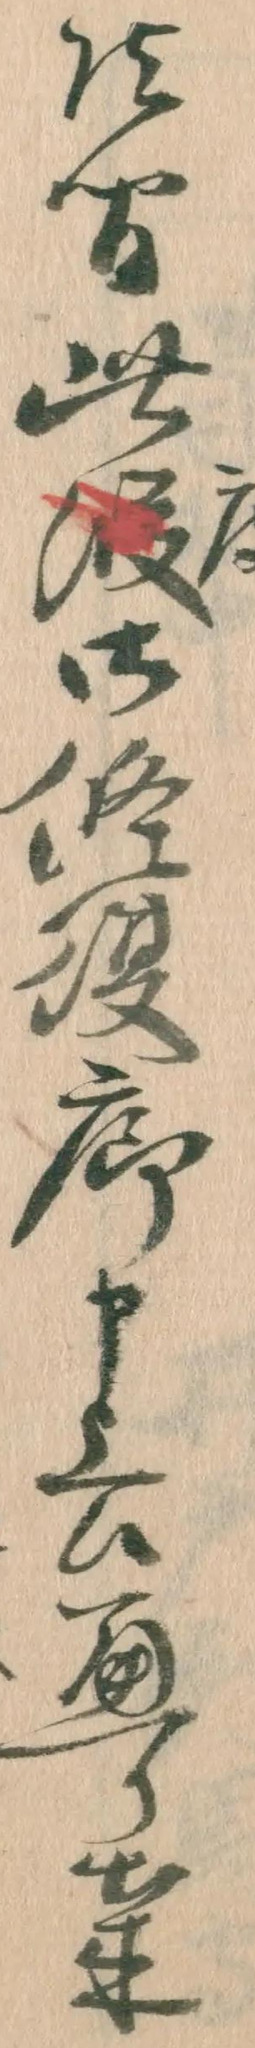候間此度御修復序申上候通り出来
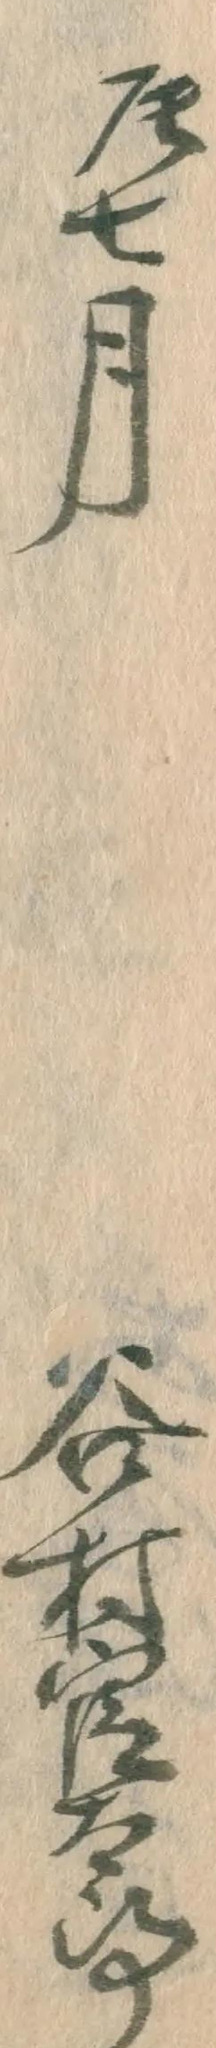辰七月谷村官太郎
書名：七十冊物類集 71巻. [44] 四十三 牢屋敷御普請御修覆地震ニ付骨折候牢屋掛御褒美之部
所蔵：国立国会図書館 National Diet Library, JAPAN
